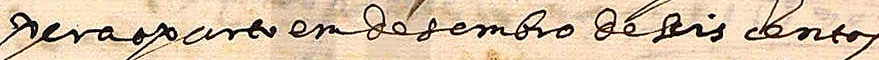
pera o parto em desembro de seiscentos
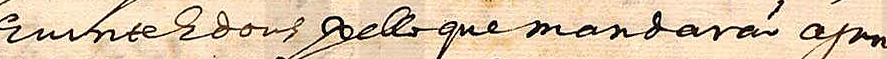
E uinte E dous pello que mandaraõ ajun
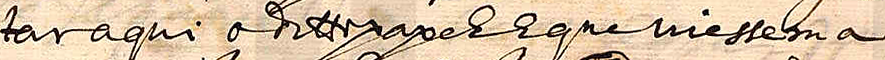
tar aqui o ditto papel E que uiessem a
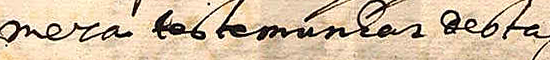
meza testemunhar desta
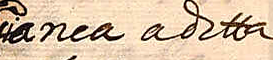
iança a ditta
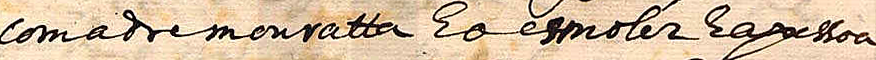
comadre mouratta E o esmoler E a pessoa
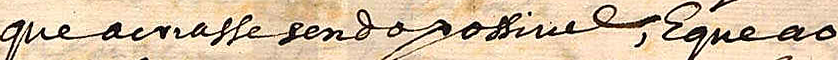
que a criasse sendo possiuel, E que ao
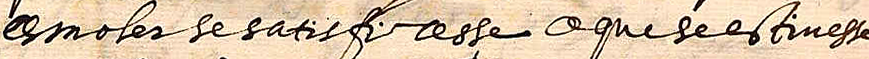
esmoler se satisfizesse o que se estiuesse
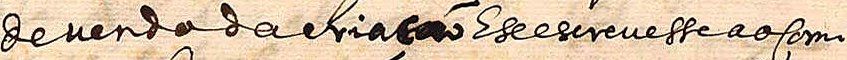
deuendo da criaçaõ E se escreuesse ao Comi
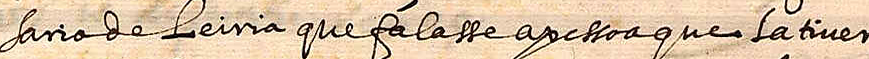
sario de Leiria que falasse a pessoa que la tiuer
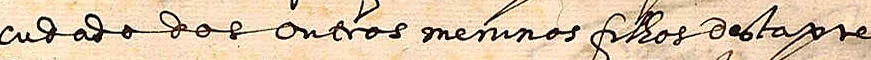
cudado dos outros meninos filhos desta pre
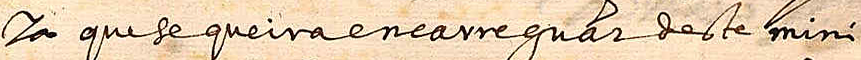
Za que se queira encarreguar deste mini
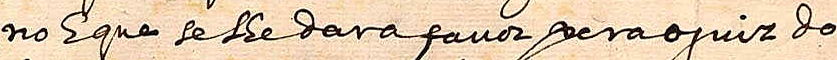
no E que se lhe dara fauor pera o juiz do
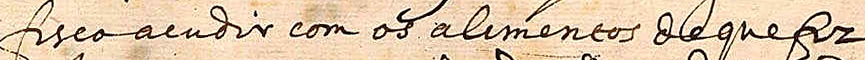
fisco acudir com os alimentos de que fiz
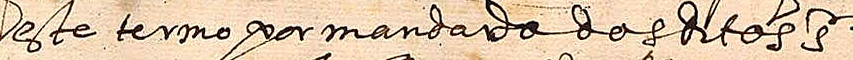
este termo por mandado dos ditos sres
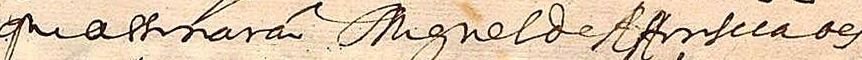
que assinaraõ Miguel de Affonseca o es
